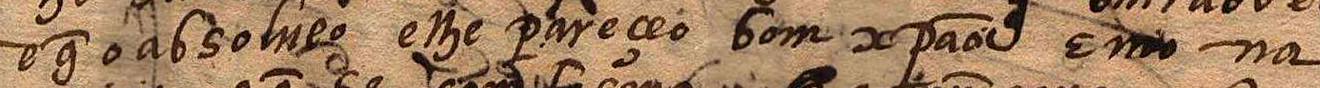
e q̄ o absolueo e lhe pareceo bom xpãao e uio na
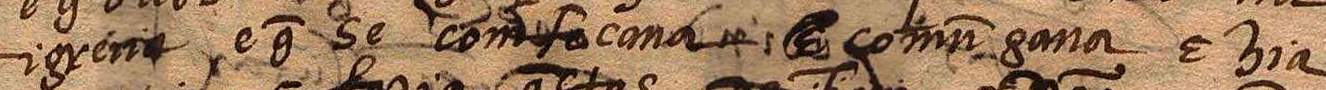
igreiia e q̄ se confeçaua e comūgaua E hia
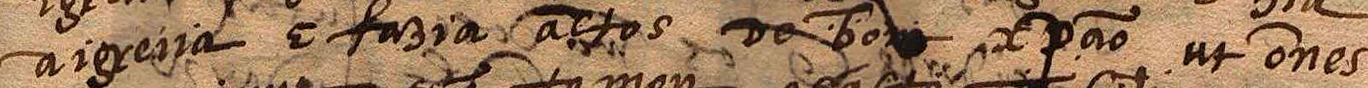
a igreiia E fazia actos do bom xpão ut ōnes
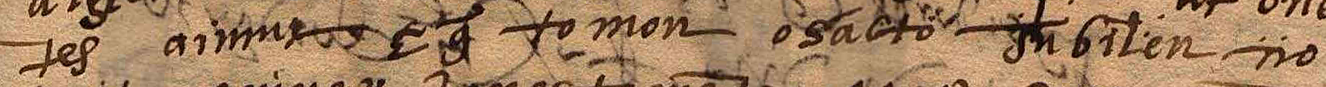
tes aiumt E q̄ tomou o sācto Jubileu no
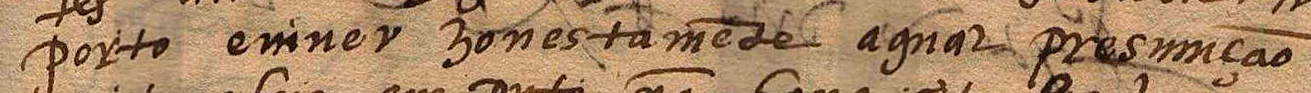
porto e uiuer honestamēte a qual presumção
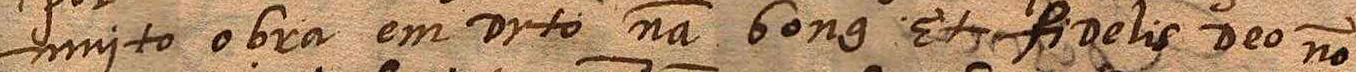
mujto obra em drto n̄a bonꝯ Et fidelis deo n̄o
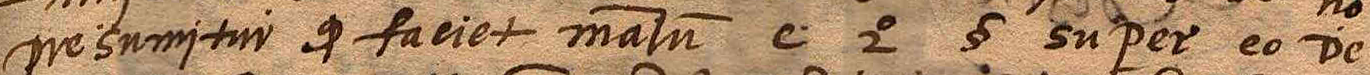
presumjtur ꝙ faciet malū c. 2o § super eo de
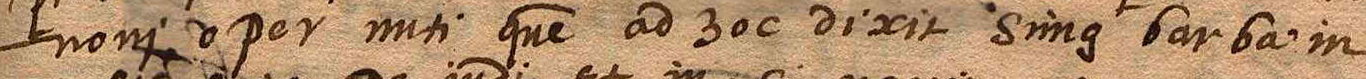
nouj oper nuti qūe ad hoc dixit srinꝯ barba. in
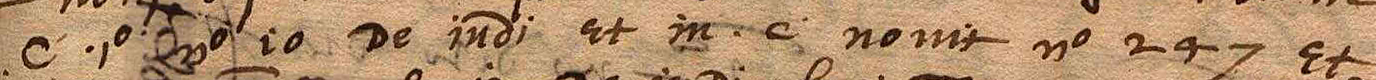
c .1o no 10 de iudi Et in c nouit no 247 Et
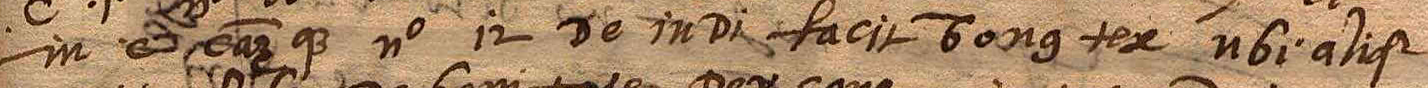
in c cās qꝫ no 12 de iudi facit bonꝯ tex ubi aliqa
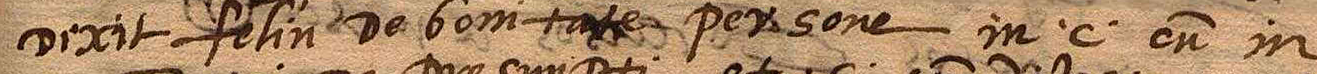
dixit felin de bonitate persone in .c. cū in
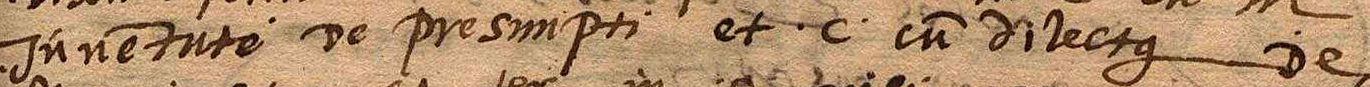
Juuētute de presumpti et .c. cū dilectꝯ de
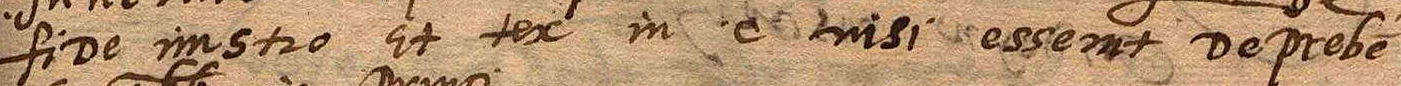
fide imstro Et tex in c nisi essemt de prebē
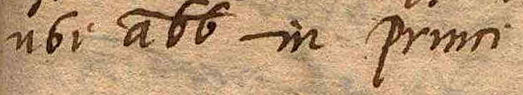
ubi ābb in princi
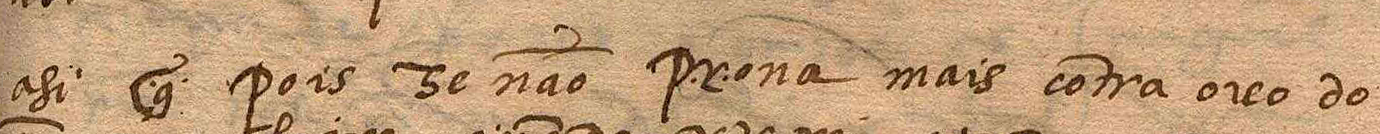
asi q̄ pois se não proua mais cōtra o reo do
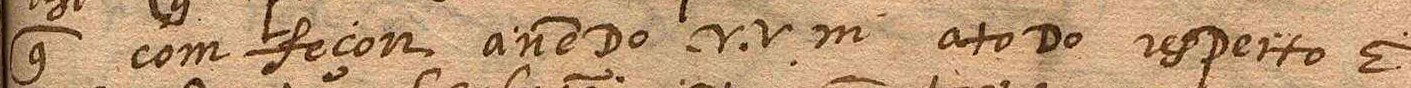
q̄ comfeçou auēdo vv m a todo respeito E
